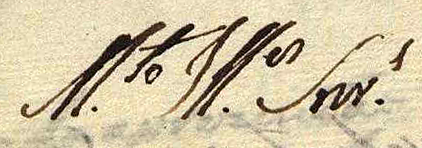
M.to Ill.es Snr.s
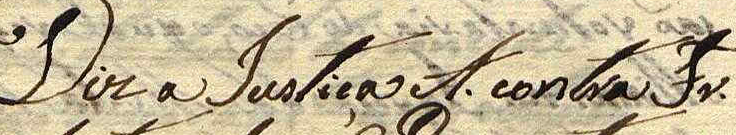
Diz a Iustiça A. contra Fr.
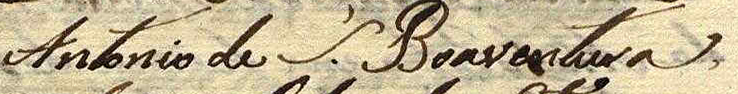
Antonio de S. Boaventura
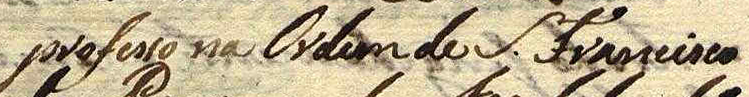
professo na Ordem de S. Francisco
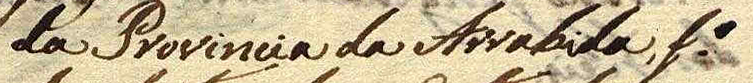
da Provincia da Arrabida, f.o
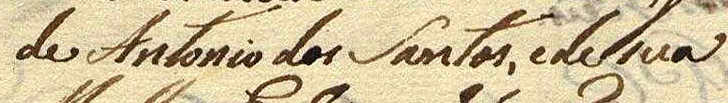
de Antonio dos Santos, e de sua
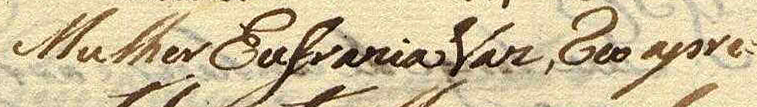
Mulher Eufrazia Vaz, Reo apre
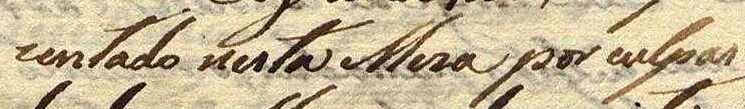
zentado nesta Meza por culpas
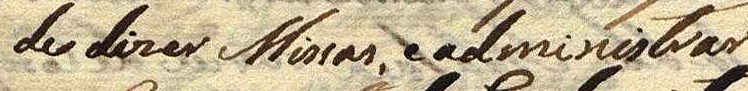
de dizer Missas, e administrar
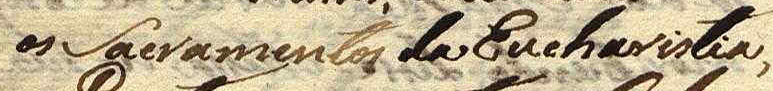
os Sacramentos da Eucharistia,
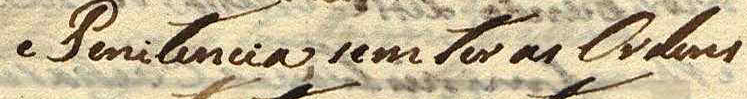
e Penitencia sem ter as Ordens
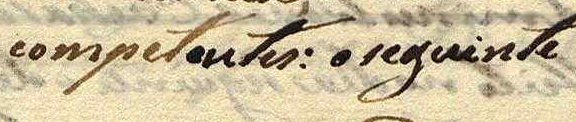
competentes: o seguinte.
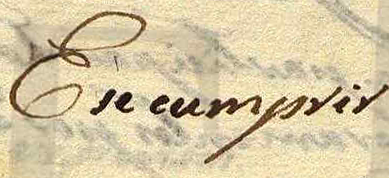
E se cumprir
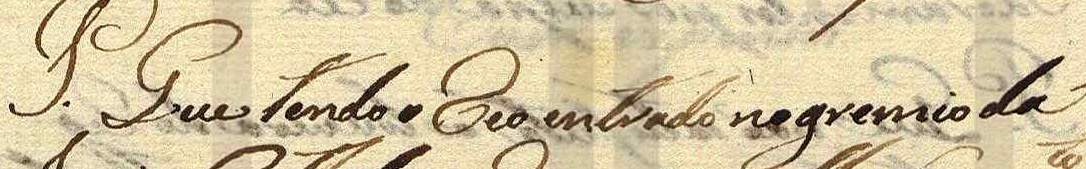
P. Que tendo o Reo entrado no gremio da
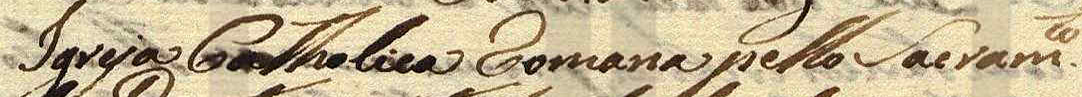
Igreja Catholica Romana pello Sacram.to
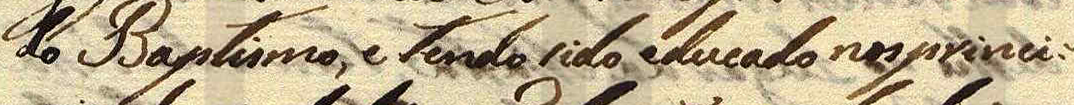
do Baptismo, e tendo sido educado nos princi
